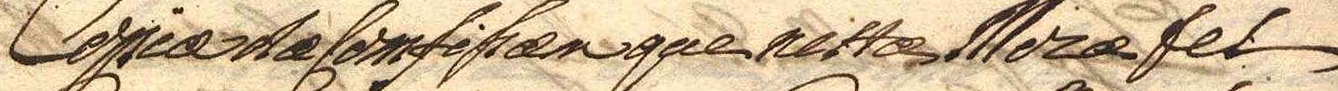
Copia da Comfissam que nesta Meza fes
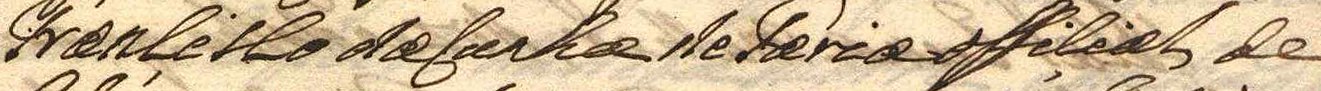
FranÇisCo da Cunha de Faria offiÇial de
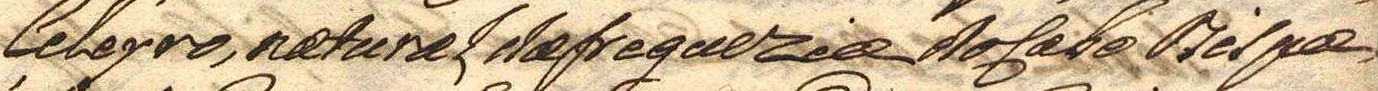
Çeleyro, natural da freguezia do Cabo Bispa
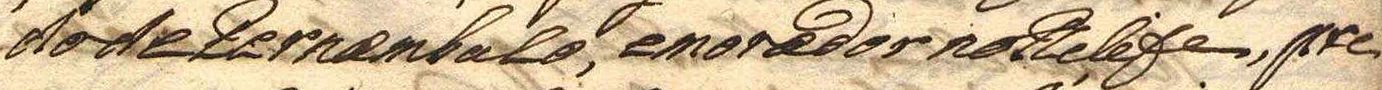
do de PernambuCo, e morador no ReÇife, pre
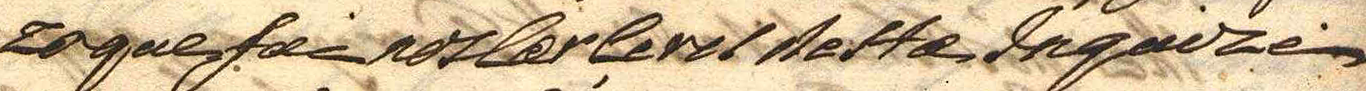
zo que foi nos CarÇeres desta Inquizi
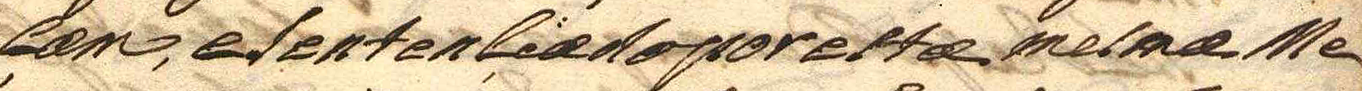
Çam, e sentenÇiado por esta mesma Me
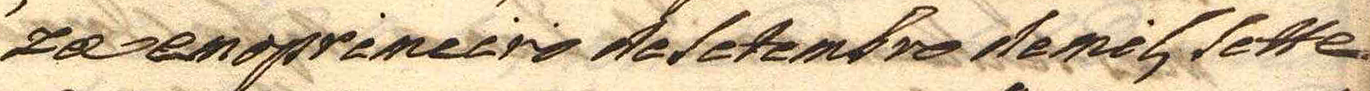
za em o primeiro de setembro de mil sette
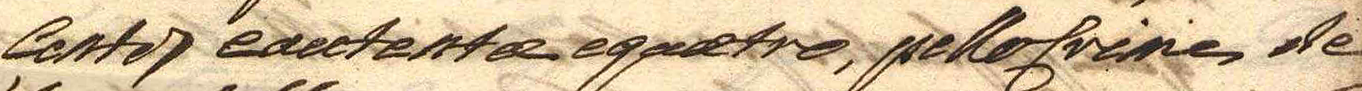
Çentos e outenta e quatro, pello Crime de
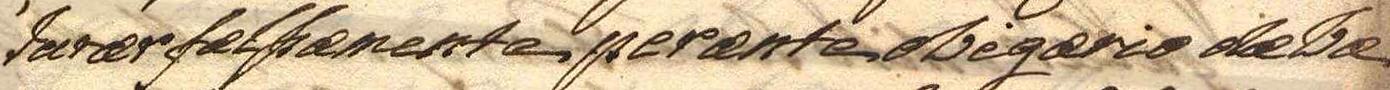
Iurar falssamente perante o vigario da va
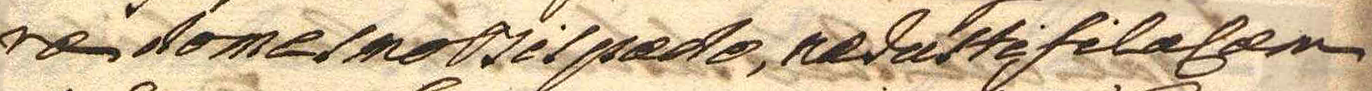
ra do mesmo Bispado, e na IustifiCaCam
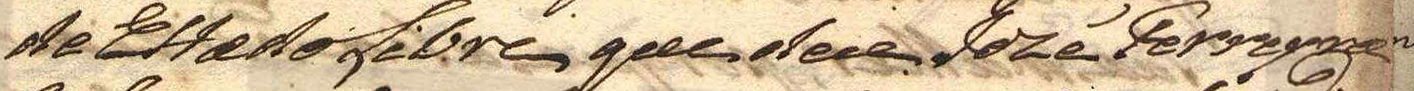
de Estado Livre que deu Iozé Ferreyra
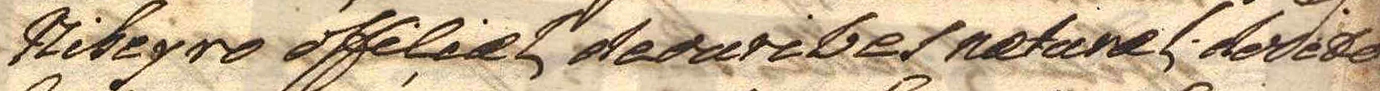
Ribeyro offiÇial de ourives natural do dito
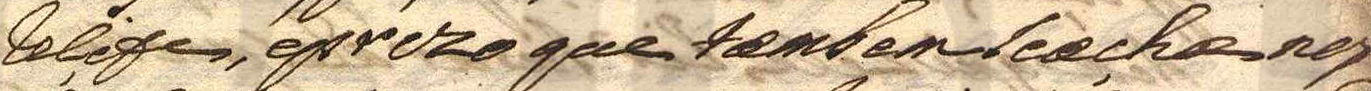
ReÇife, e prezo que tambem se açha nos
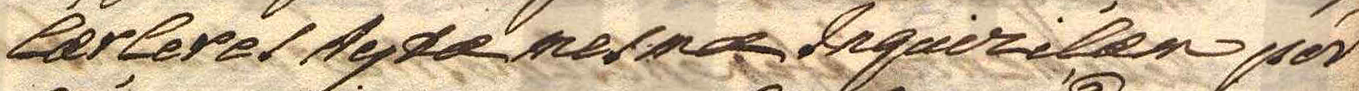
CarÇeres desta mesma InquiziÇam por
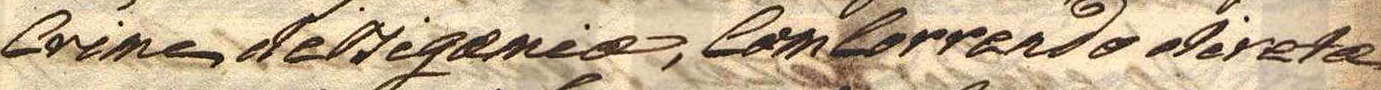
Crime de Bigamia, ComCorrendo direta
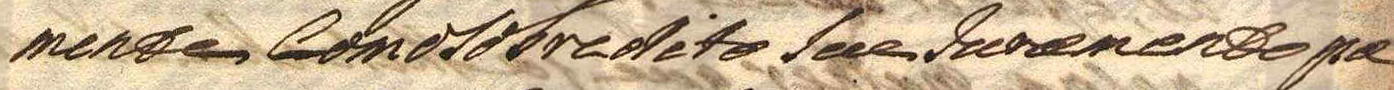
mente Com o sobredito seu Iuramento pa
